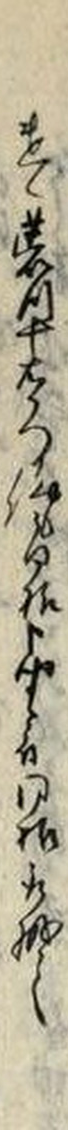遣候荒川十右衛門儀も同様申聞候に付同様取掛候事
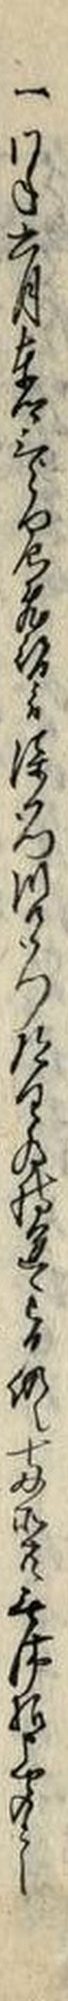一同年六月東郷三郎右衛門屋敷替に付漆御門川口御門道具為持運候旨仍之両所共無滞候様申聞之
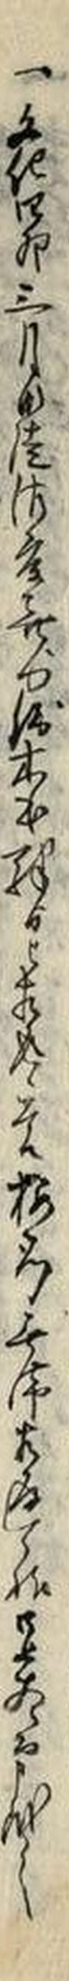一文化四卯三月御徒佐藤喜右衛門儀木本駅ゟ被相返候節桜御門無滞相通候様口上使に而申越之
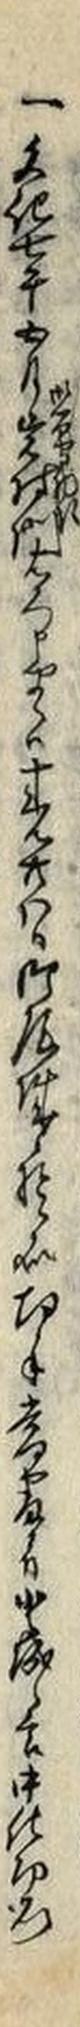一文化七午五月御留守物頭岩村門右衛門申聞候は来る廿八日御帰城被遊候処切手当番に付登城之節中仕切御門
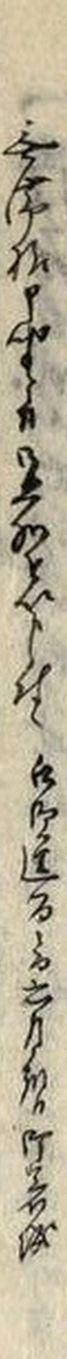無滞候様申聞候に付口上扣を以申付候但御遅留に而六月朔日御着城
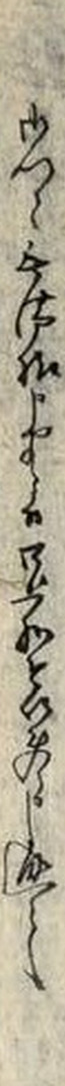御門々々無滞様申聞候に付口上扣を以夫々申通之
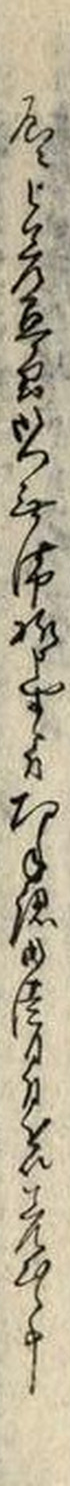屋に被差置候間御門無滞候様申聞候に付切手認御徒目付を以差出候事
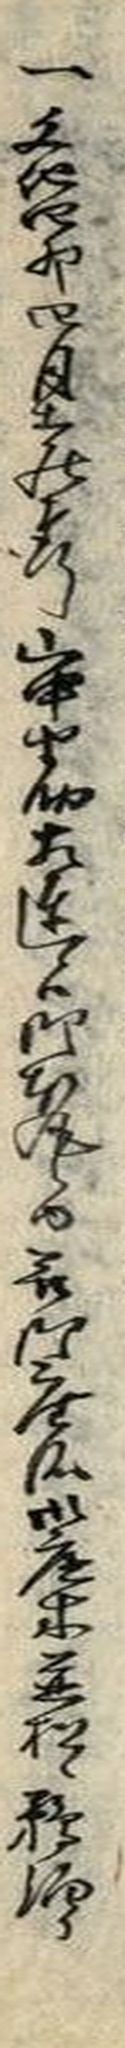一文化四卯四月土居奉行山中半助相達候は御本丸之内并御座所御庭木並松へ鵜泊り
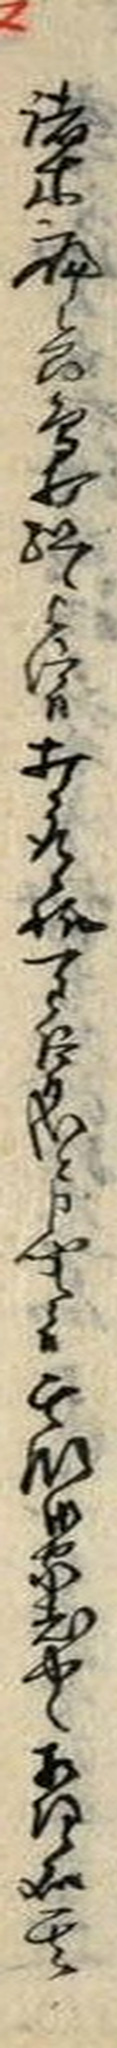諸木痛候間鳥打組へ被仰付打取候様可被仰付哉と申聞候に付其段御家老中へ相伺候処其

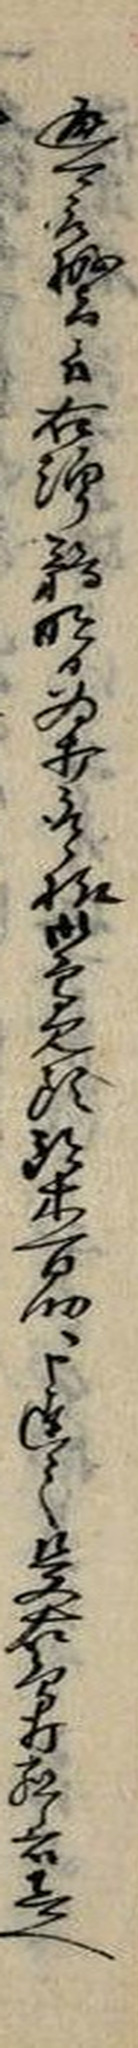通可取扱旨に付右泊り鵜明日為打取候様御鳥見頭鈴木百助へ申達之且又右鳥打之者壱人
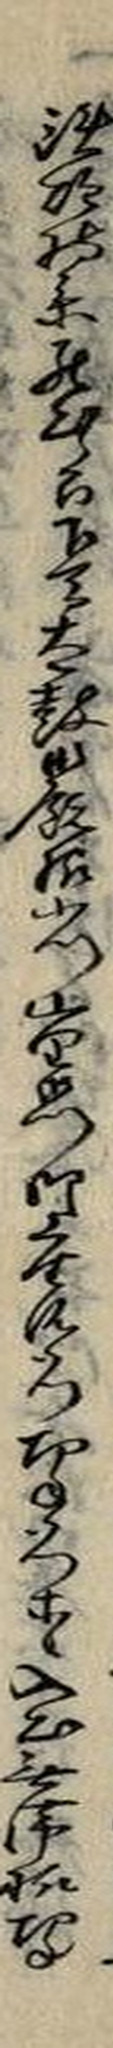鉄砲持参罷出候間下馬太鼓御厩脇小門山里御門御座所御門切手御門等に入出無滞候様切手
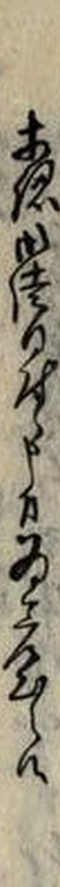相認御徒目付へ申付為差出し候
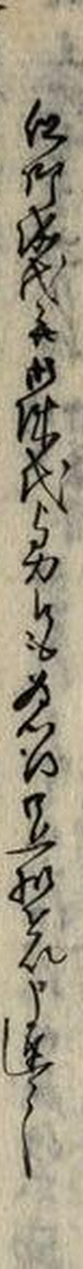但御城代并御城代与力江も為心得口上扣を以申達之
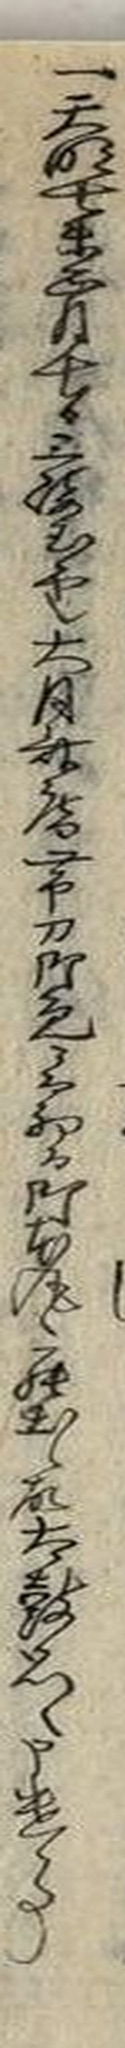一天明七未正月七日三崎玉雲大月斎庵帯刀御免に而初而御本丸へ罷出候故太鼓御門へ申遣候事
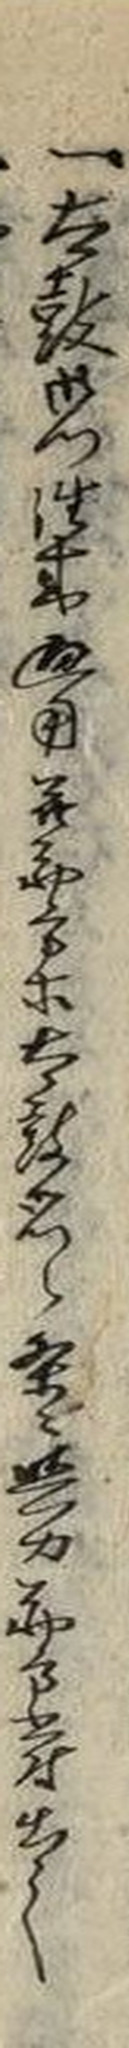一太鼓御門往来通用并勤方等太鼓御門之条に与力勤方書付出之
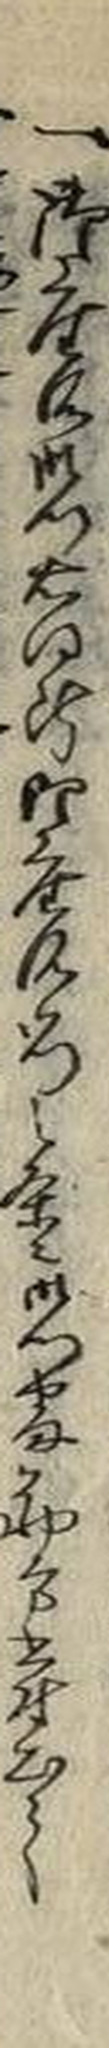一御座所御門右同断御座所御門之条に御門番勤方書付出之
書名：御門御櫓之部
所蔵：福井県文書館 Fukui Prefectural Archives
